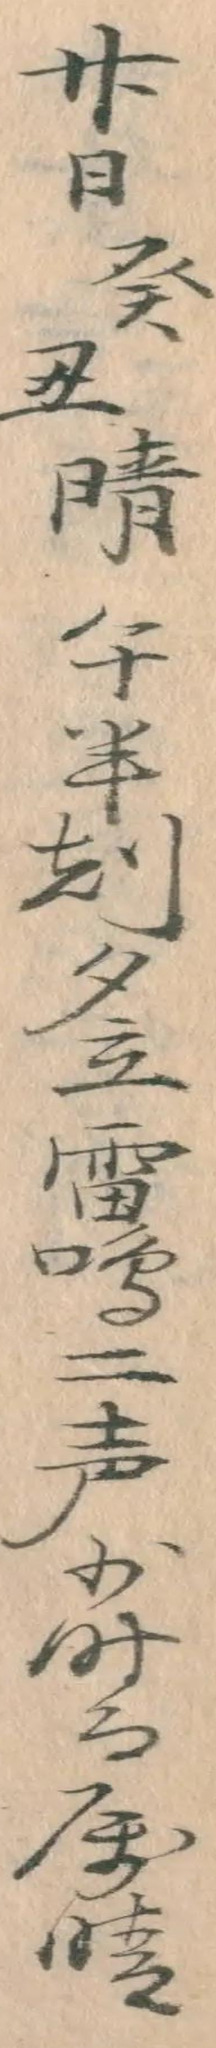廿日癸丑晴午半刻夕立雷鳴二声少時而属晴
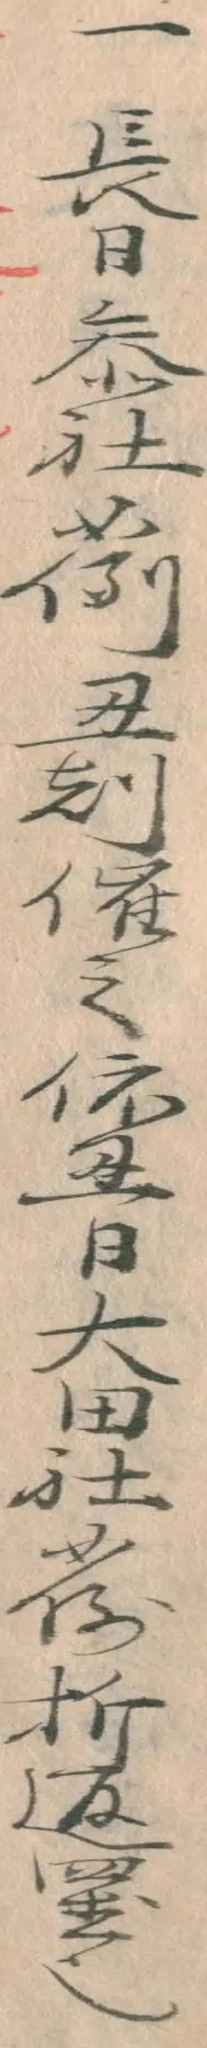一長日参社如例丑刻催之依丑日大田社少折返置也
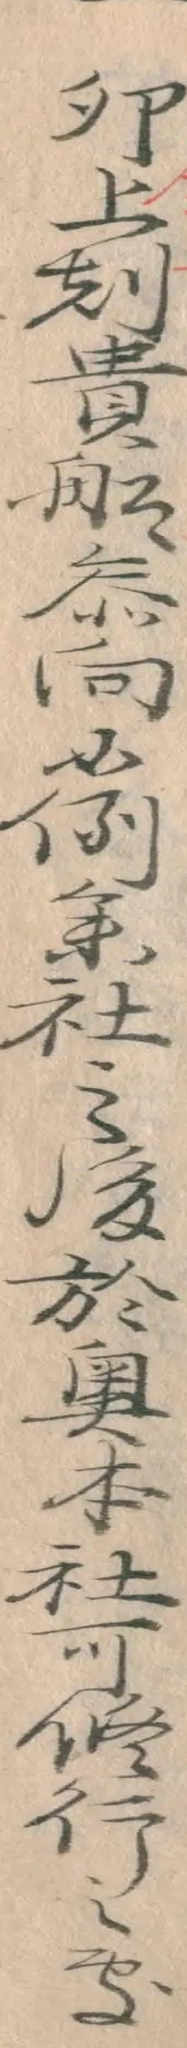一卯上刻貴舩参向如例参社之後於奥本社可修行之處
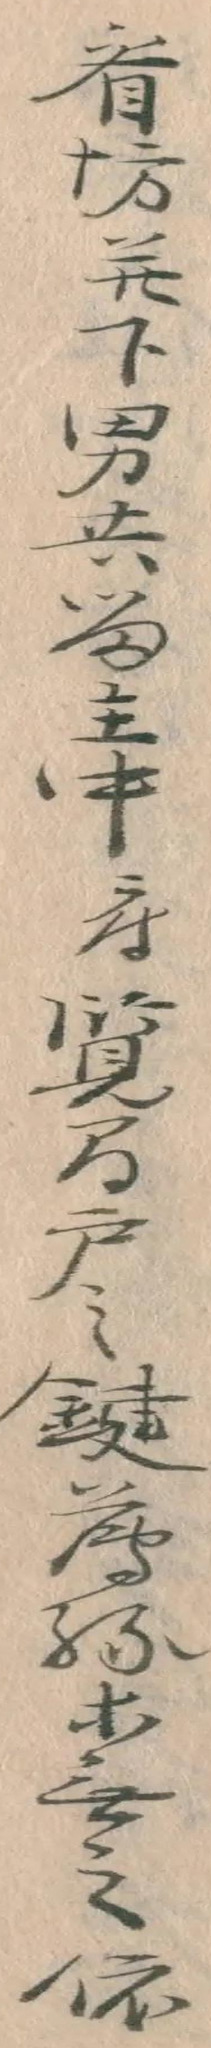看坊并下男共留主中ニ付覧間戸之鍵薄縁等無之依
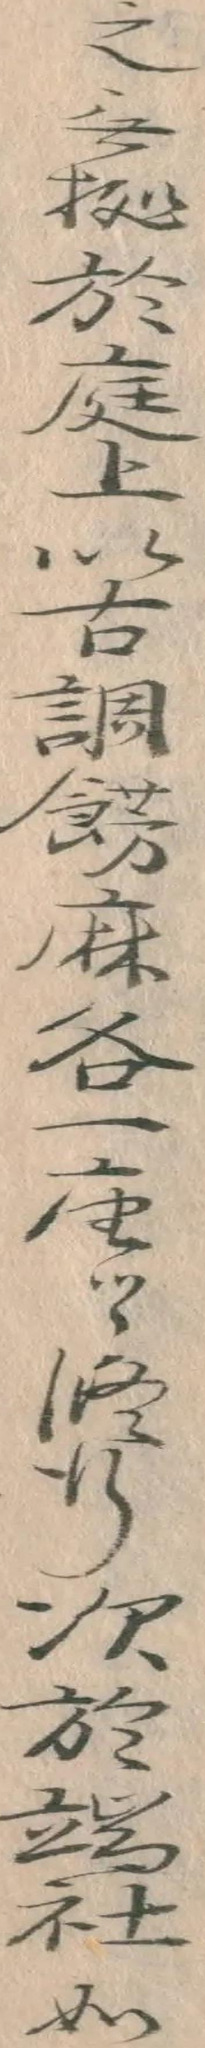之無拠於庭上以古調餝麻各一座ツヽ修行次於端社如
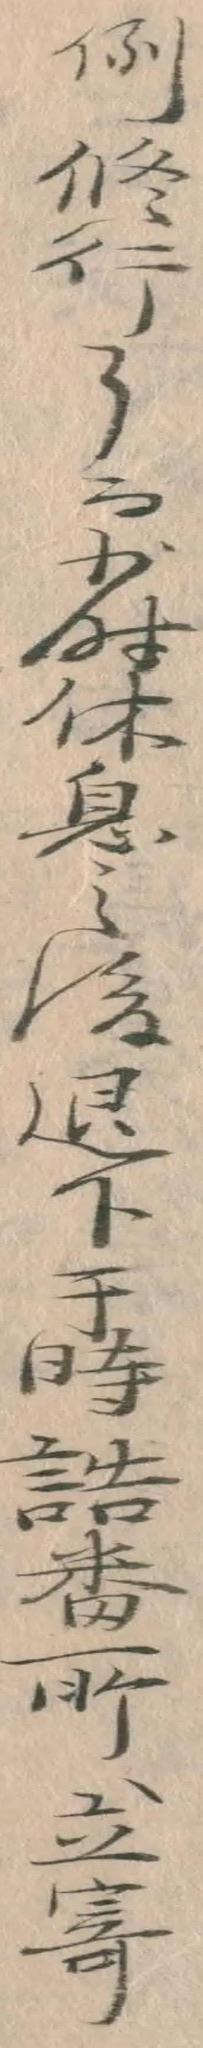例修行了而少時休息之後退下于時詰番所へ立寄
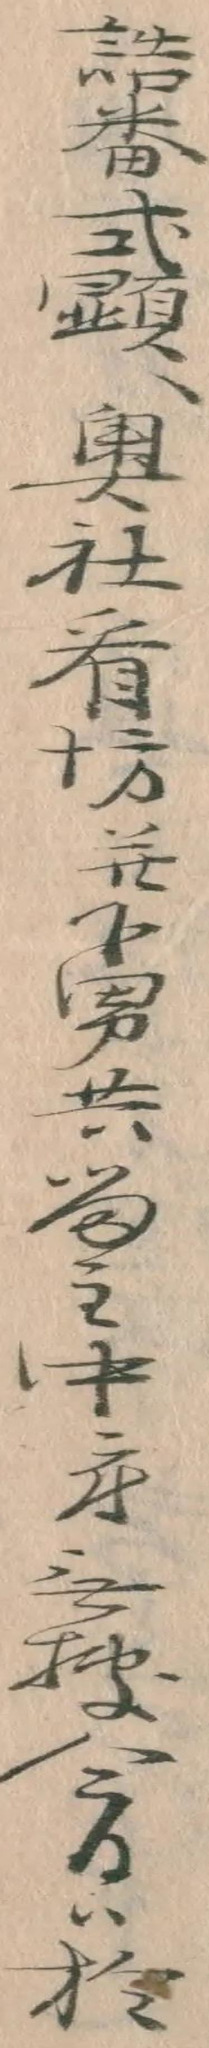詰番式顕へ奥社看坊并下男共留主中ニ付無拠今日ハ於
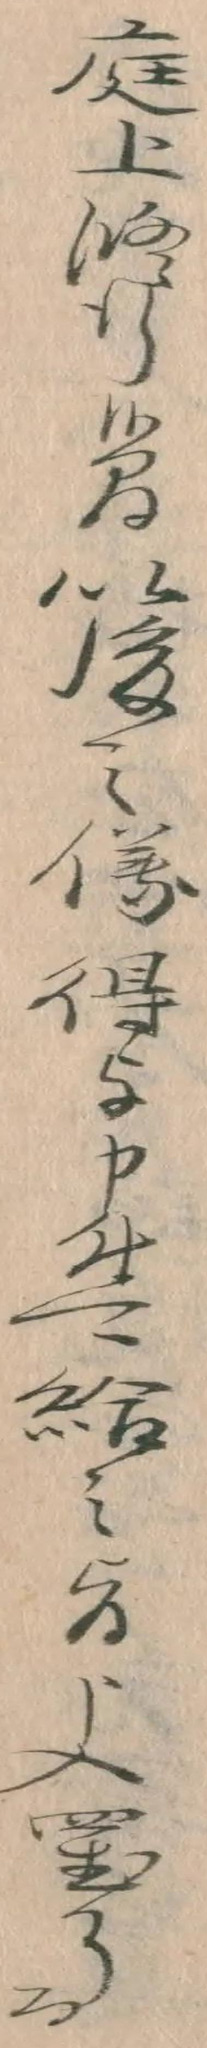庭上修行候間以後之儀得と申付可給之旨申入置了而
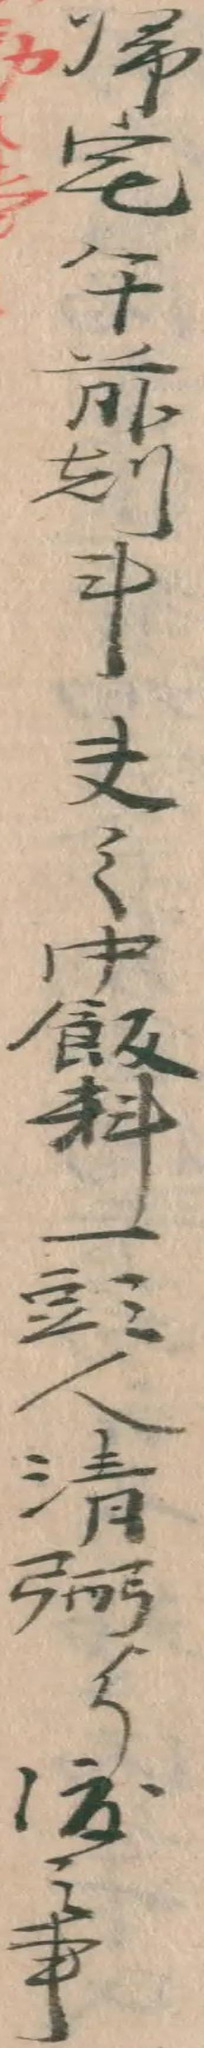帰宅午前刻斗夫々中飯科一頭人清弼より渡之事
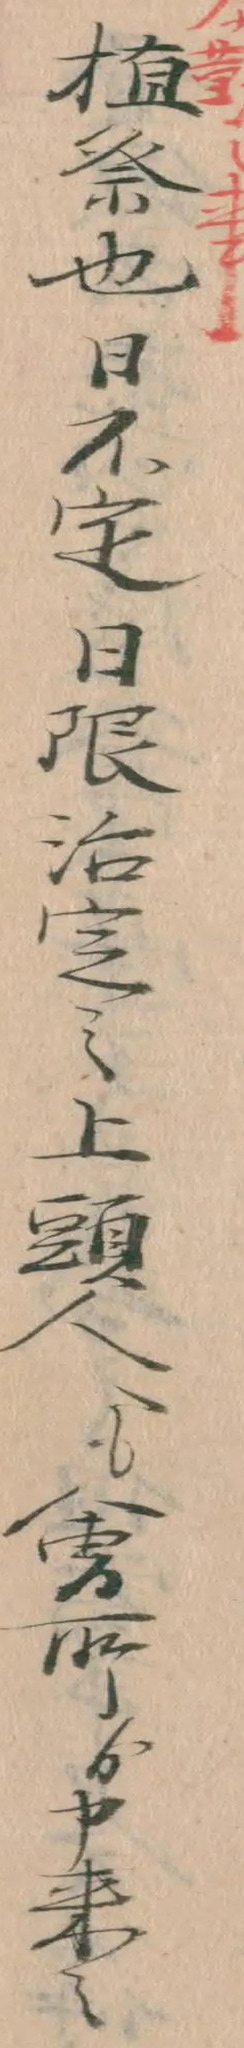一植祭也日不定日限治定之上頭人へも會所ゟ申来之
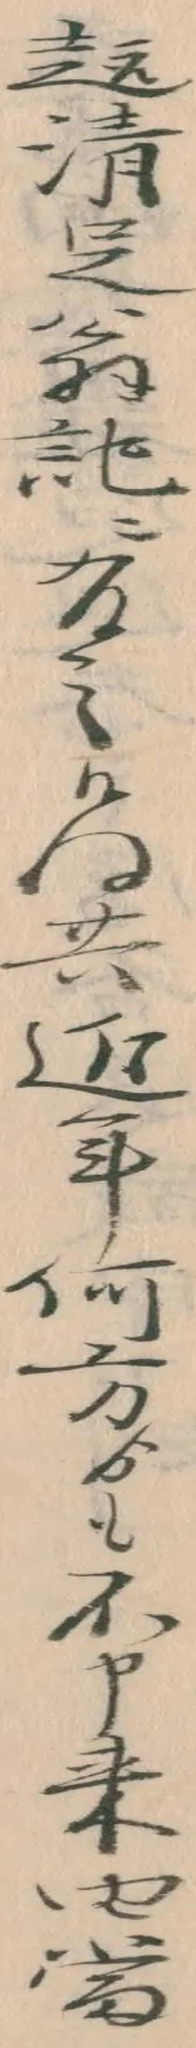趣清足翁記ニ有之候得共近年何方ゟも不申来由當
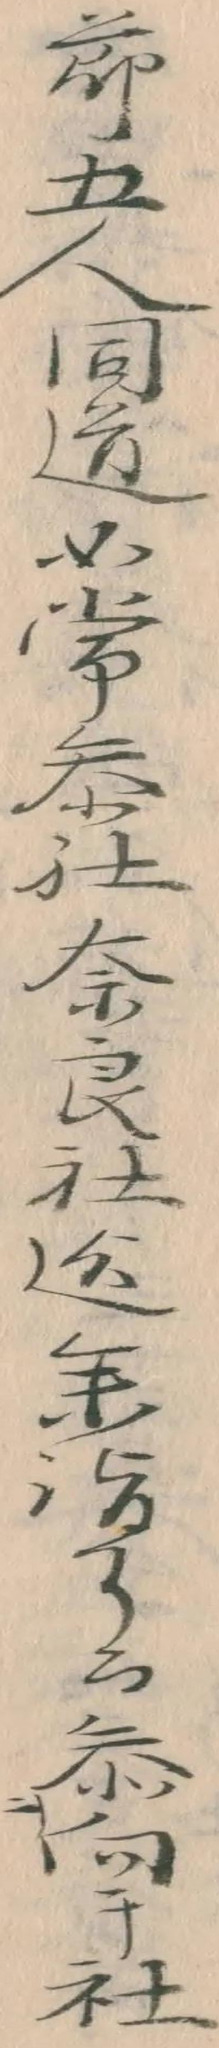節五人同道如常参社奈良社迄参詣了而参向于社
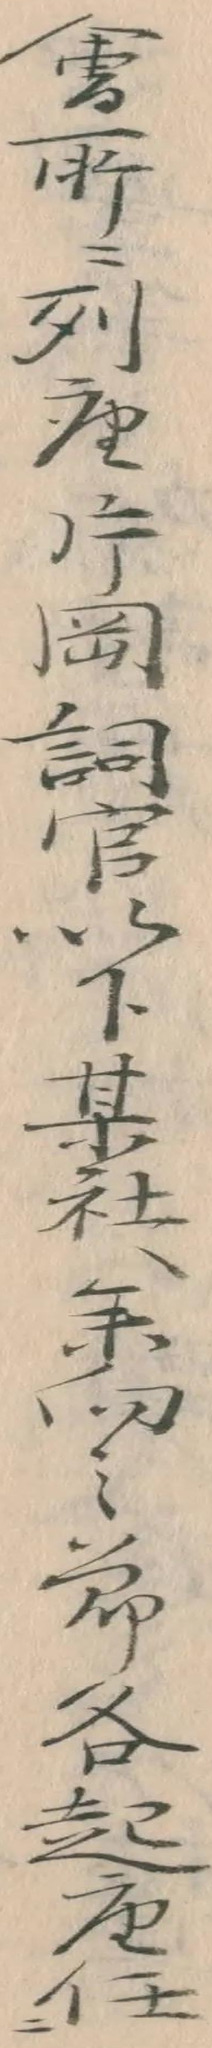會所ニ列座片岡詞官以下某社へ参向之節各起座任
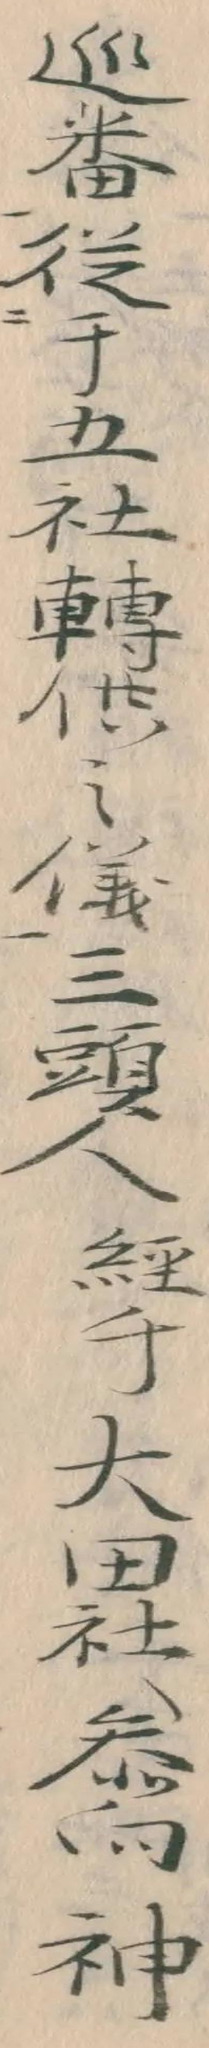巡番従于五社轉供之儀三頭人経千大田社へ参向神

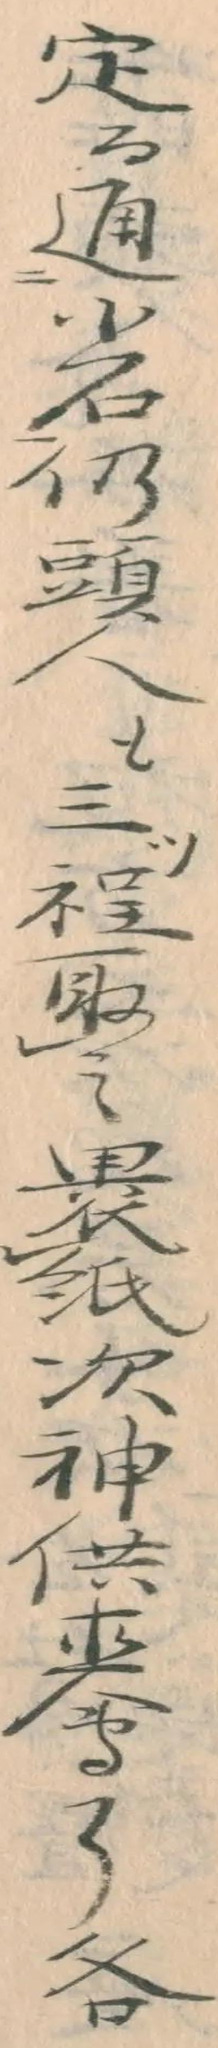定而通小石仍頭人も三ツ程取之褁紙次神供直會了各
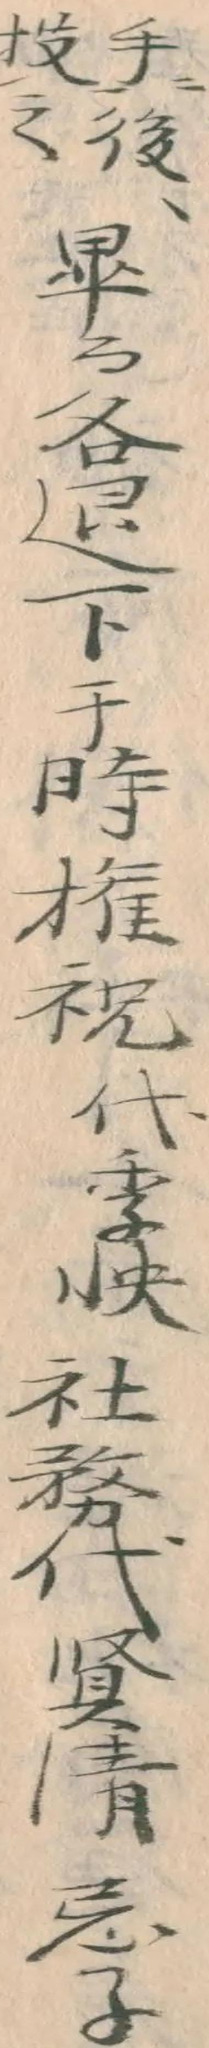手後投之畢而各退下于時権祝代季快社務代賢清忌子
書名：賀茂社記録. 第73冊
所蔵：国立国会図書館 National Diet Library, JAPAN
